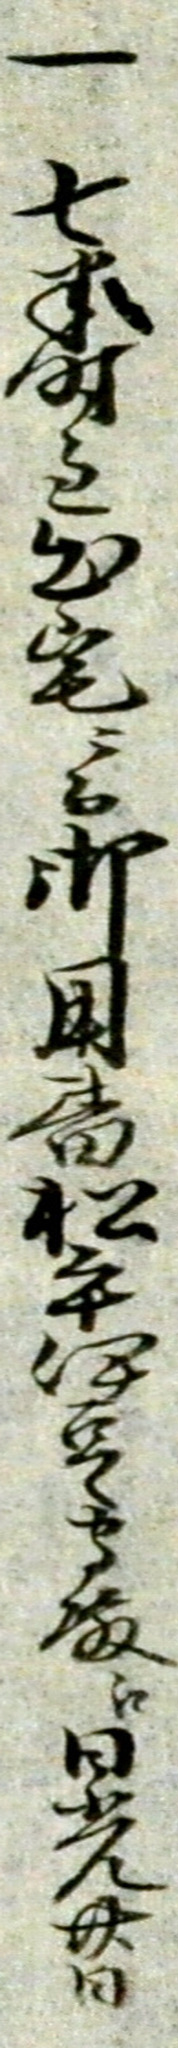一七半時過出宅ニ而御用番松平伊豆守殿江日光廿日
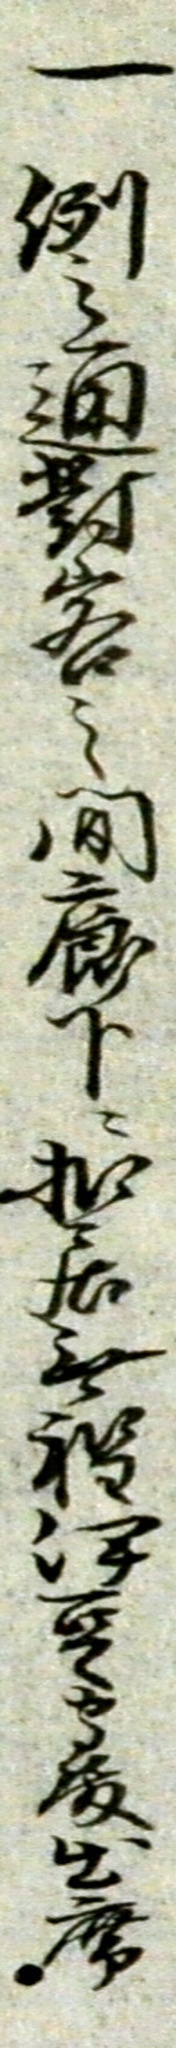一例之通対客之間廊下ニ扣居り無程伊豆守殿出席
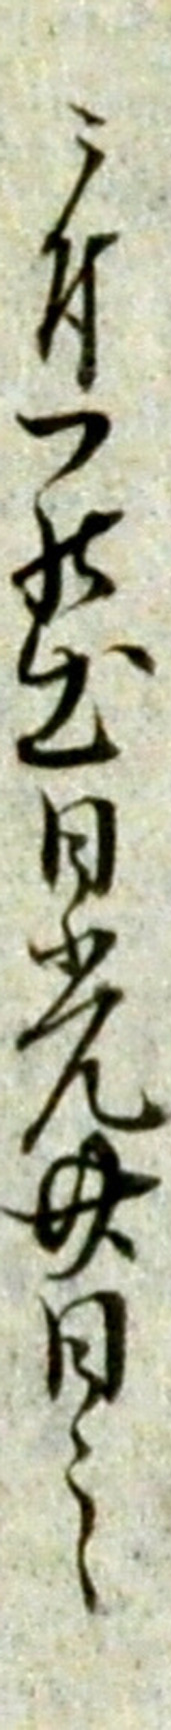ニ付罷出日光廿日之
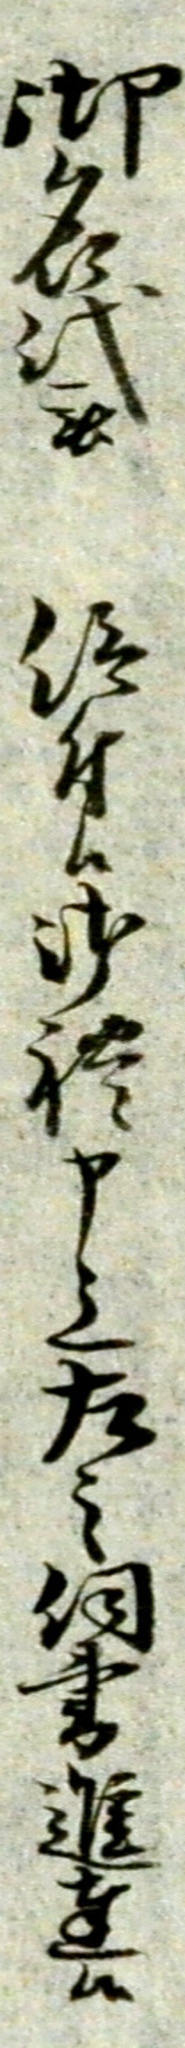御名代被仰付候御礼申上左之伺書進達候
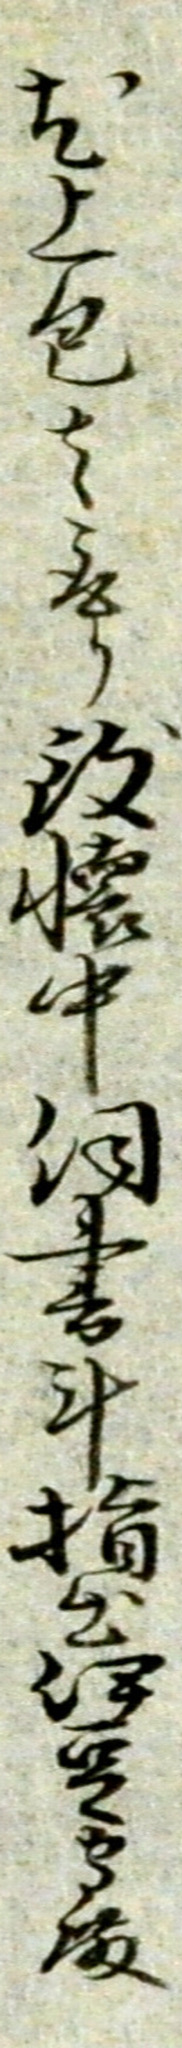尤上包者取致懐中伺書斗指出伊豆守殿
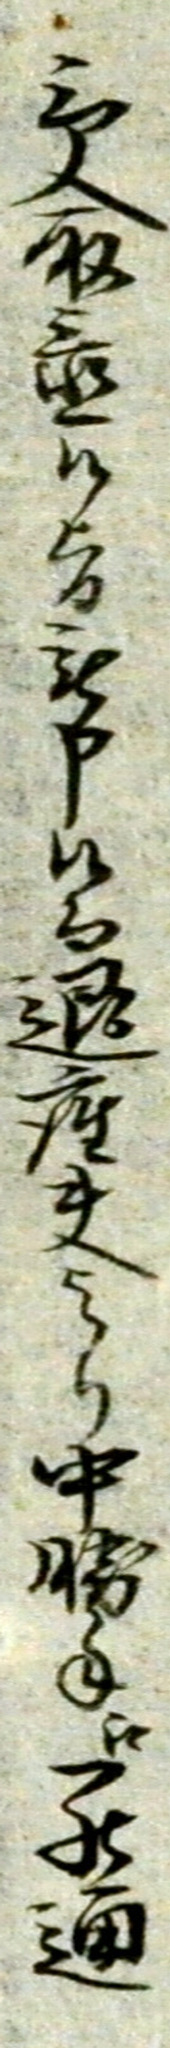受取置候旨被申候而退座夫より中勝手江罷通
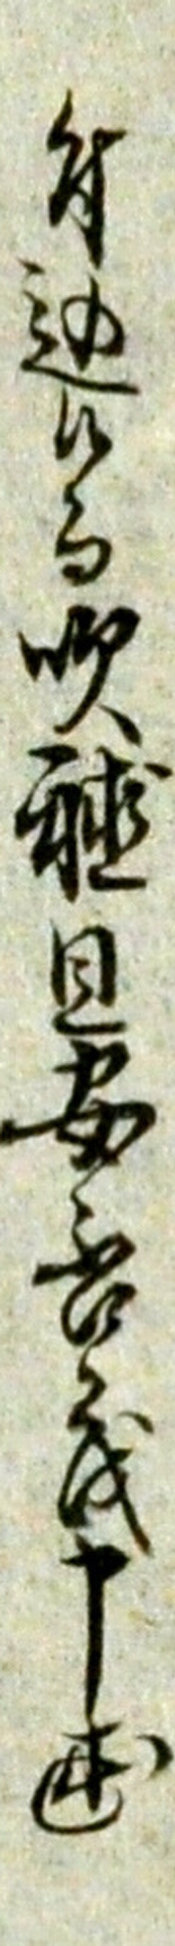付込候而吹聴且安否茂申述
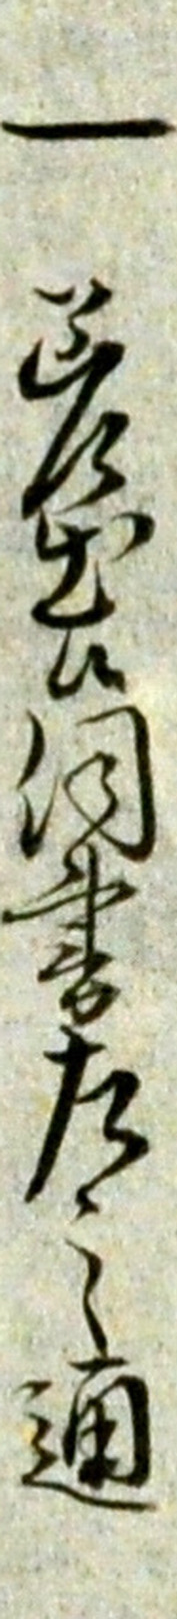一差出候伺書左之通
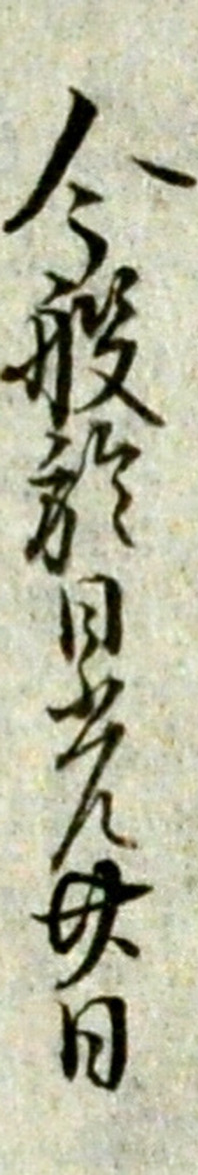今般於日光廿日
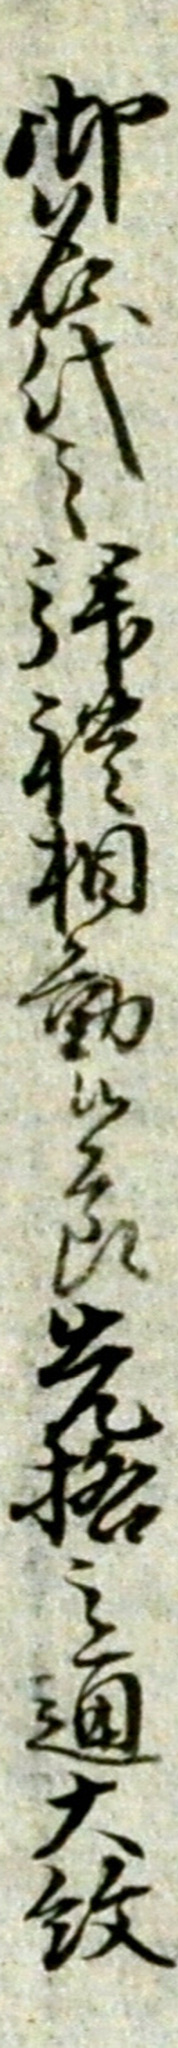御名代之拝礼相勤候節先格之通大紋
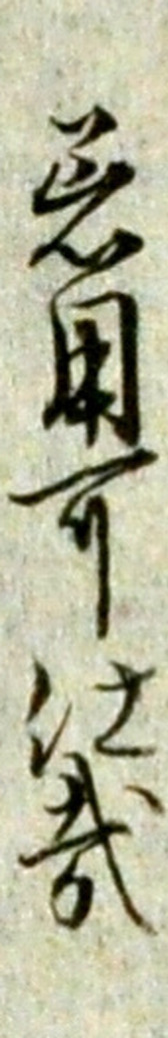着用可仕哉
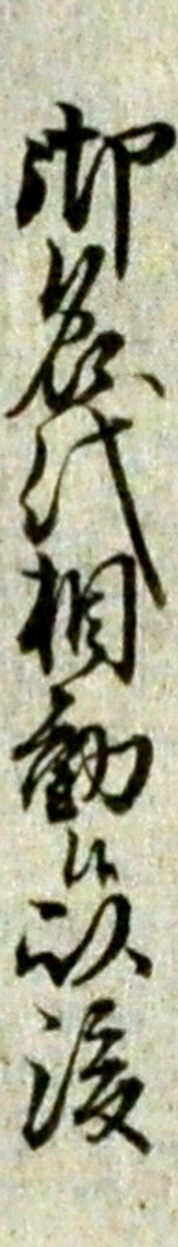御名代相勤候以後
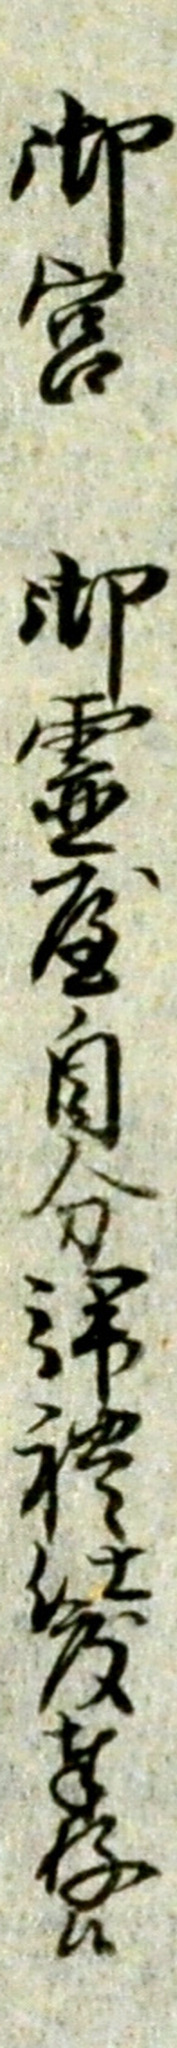御宮御霊屋自分拝礼仕度奉存候
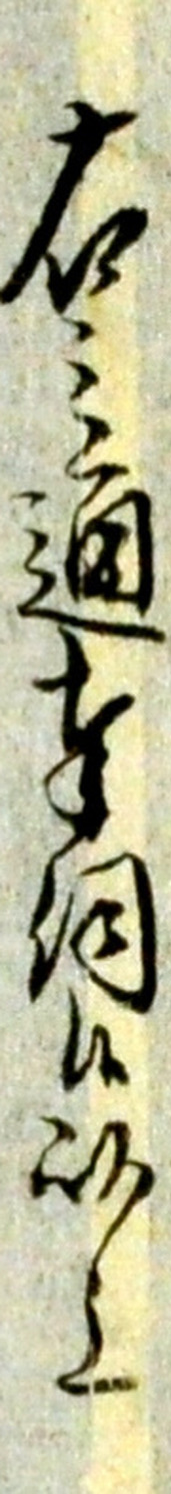右之通奉伺候以上
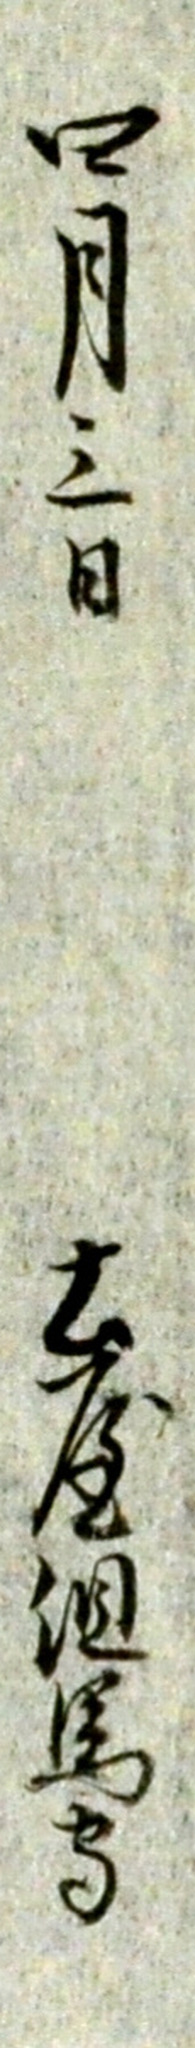四月三日土屋但馬守
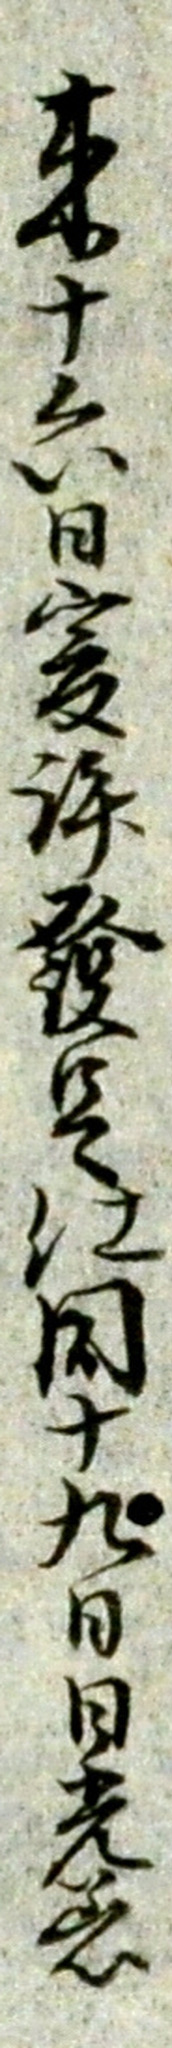来十六日爰許発足仕同十九日日光着
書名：日光御名代相勤候節ノ留
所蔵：伊那市立高遠町図書館・合同会社AMANE
